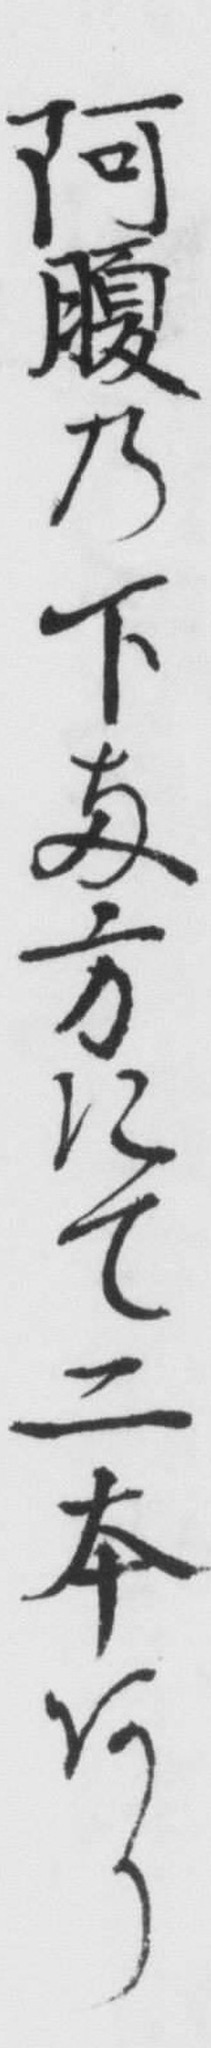針骨阿腹の下両方にて二本あり
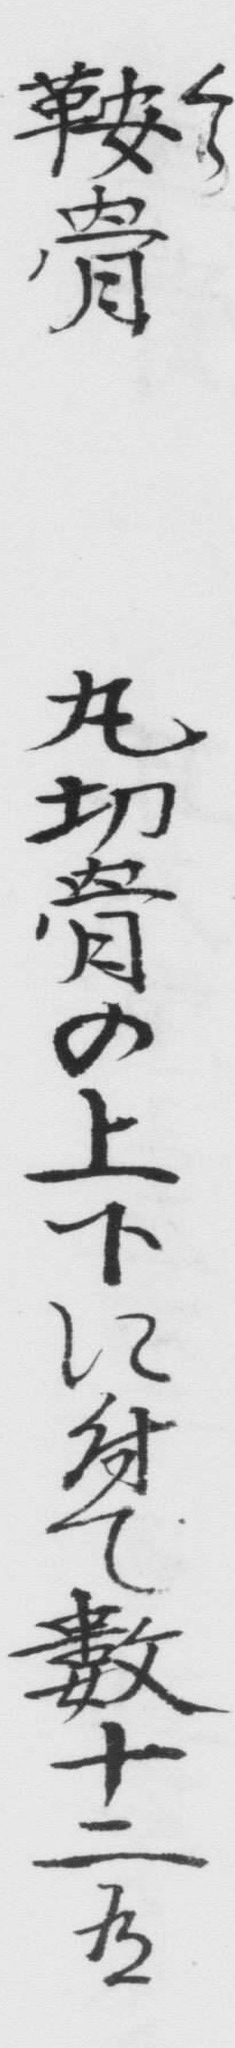鞍骨丸切骨の上下に付て数十二有
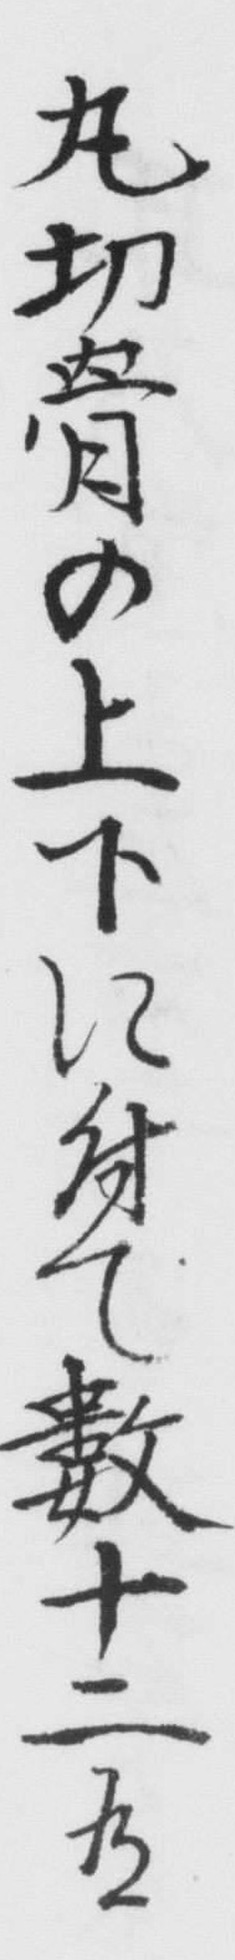鞍骨丸切骨の上下に付て数十二有
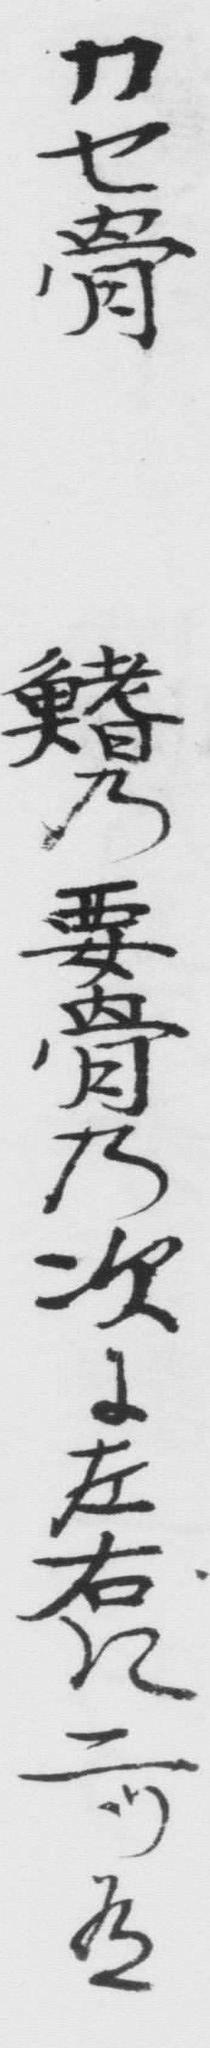カセ骨鰭の要骨の次に左右に二ツ有
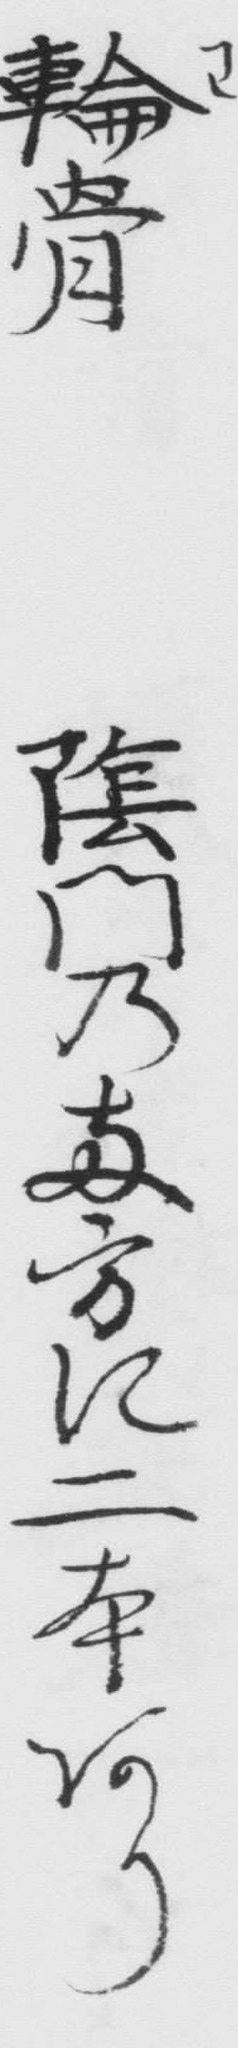輪骨陰門の両方に二本あり
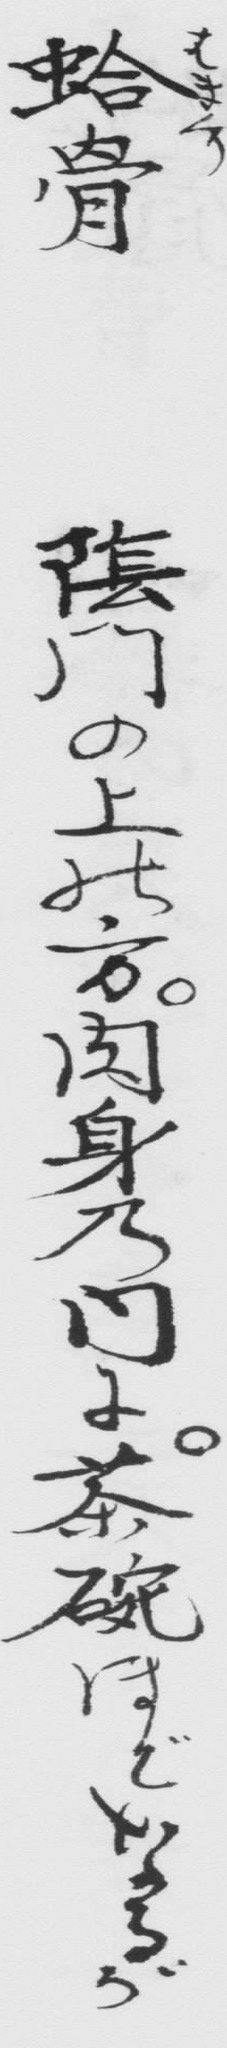蛤骨陰門の上の方。肉身の内に。茶碗ほどなるが
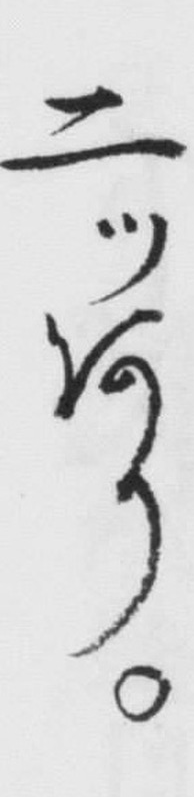二ツあり。
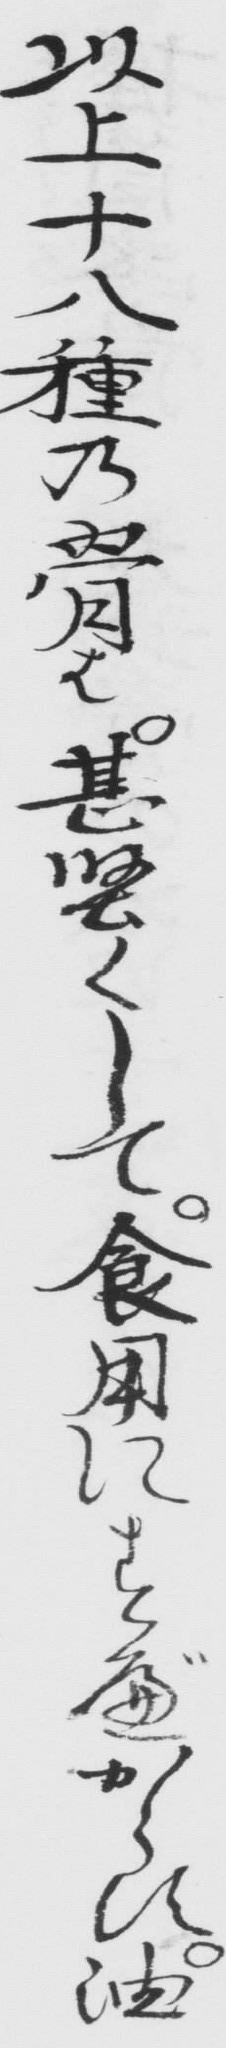以上十八種の骨は。甚堅くして。食用にすべからす。油
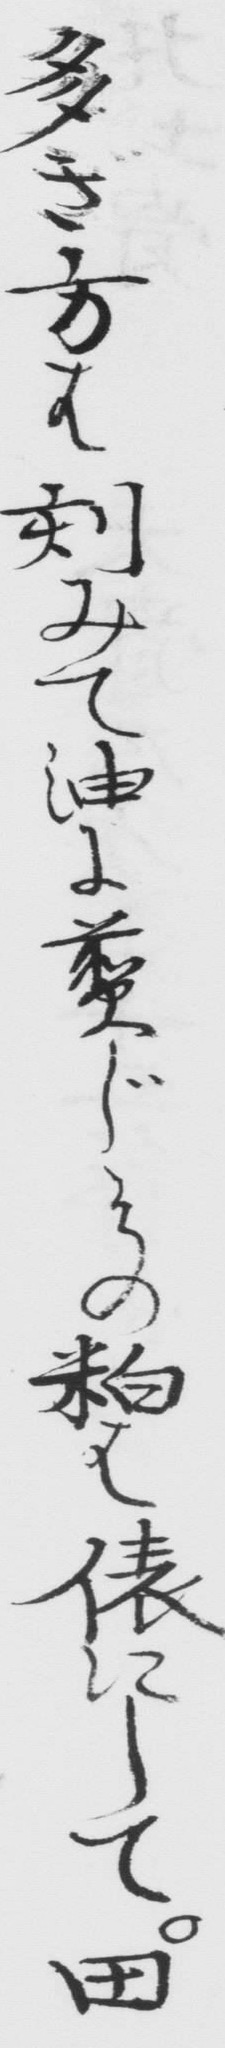多き方は刻みて油に煎じその粕は俵にして。田
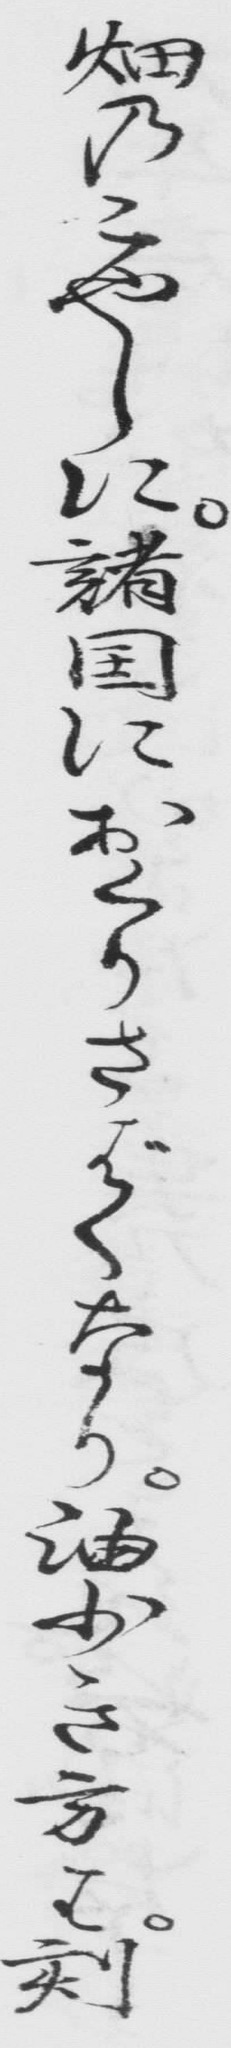畑のこやしに。諸国におくりさばくなり。油少き方は。刻
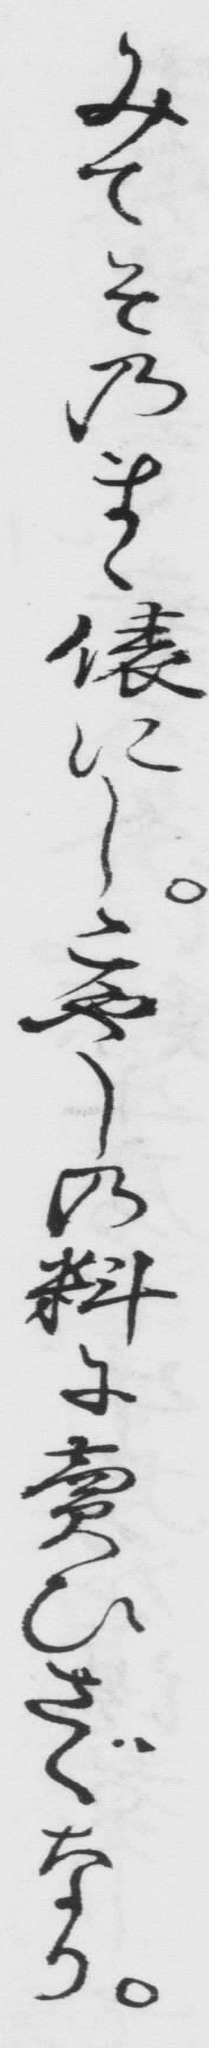みてそのまゝ俵にし。こやしの料に売ひさぐなり。
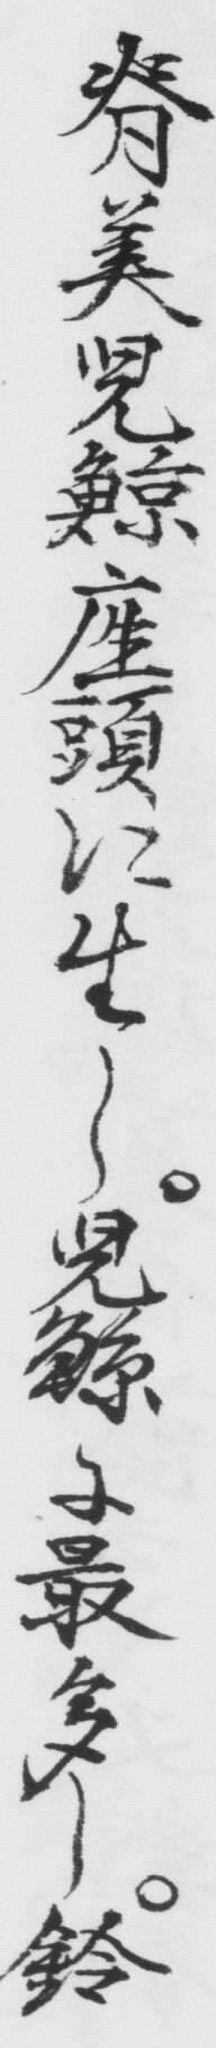虱背美児鯨座頭に生し。児鯨に最多し。鈴
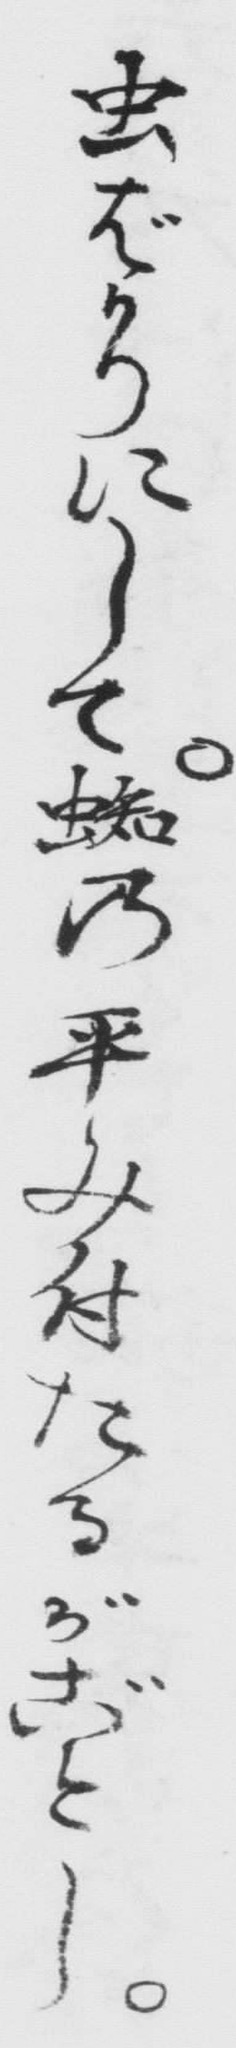虫ばかりにして。蜘の平み付たるがごとし。
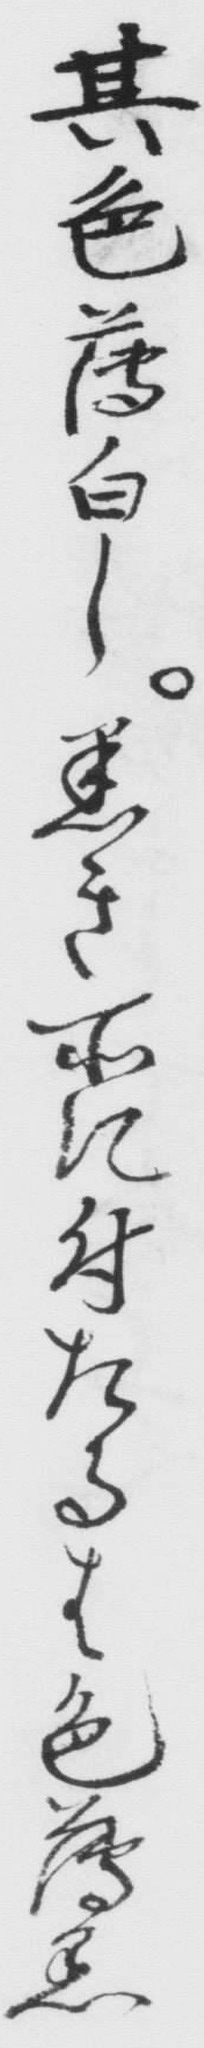其色薄白し。黒き所に付たるは色薄黒
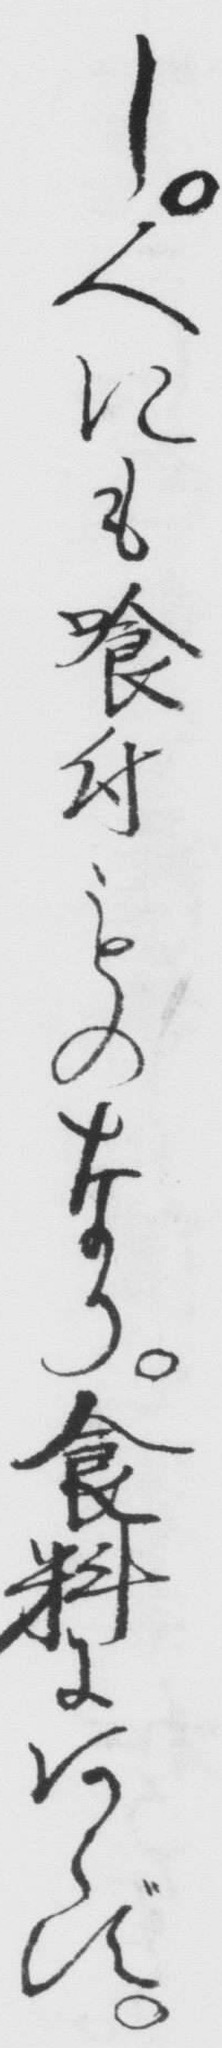し。人にも喰付ものなり。食料にあらず。
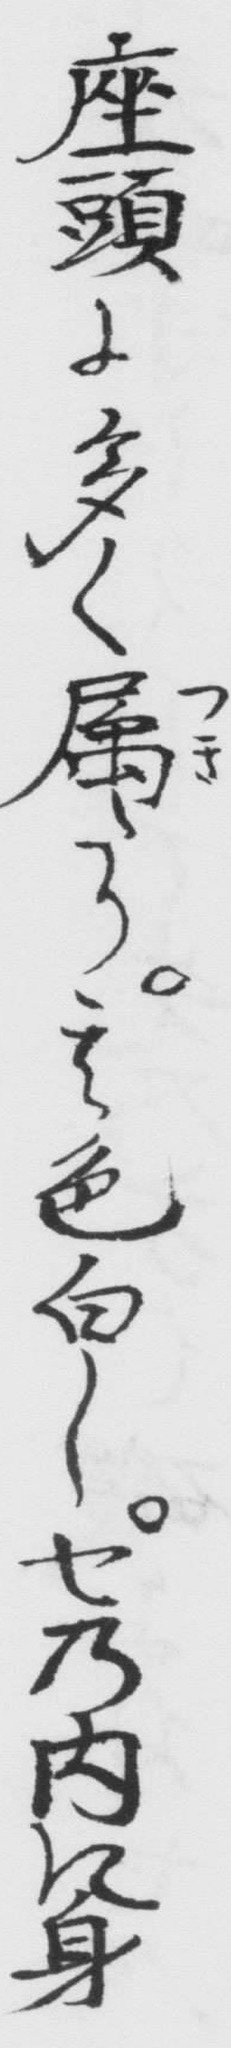座頭に多く属たり。其色白し。セの内に身
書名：鯨肉調味方
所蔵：大阪府立大学学術情報センター 国文学研究資料館
